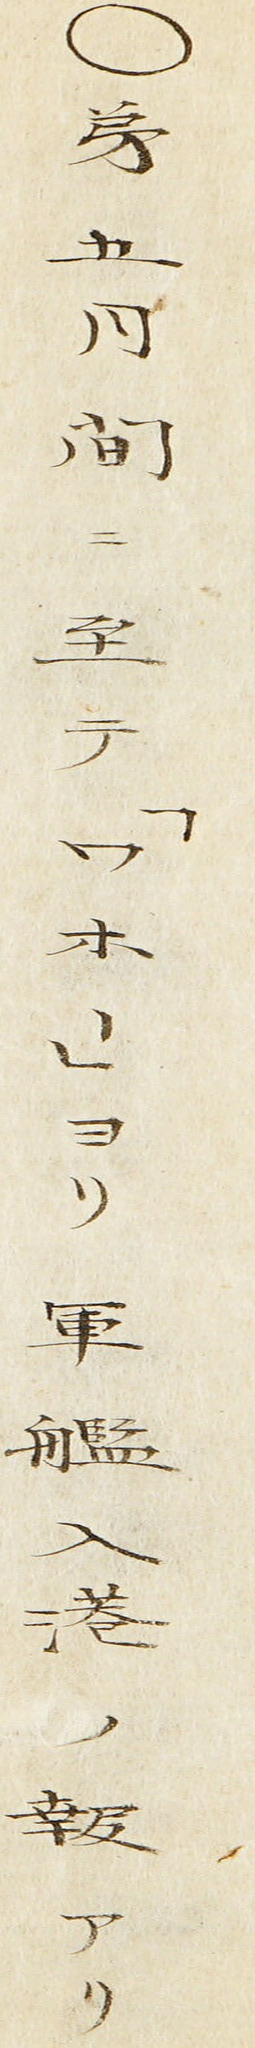○第五月間ニ至テ「ワホー」ヨリ軍艦入港ノ報アリ
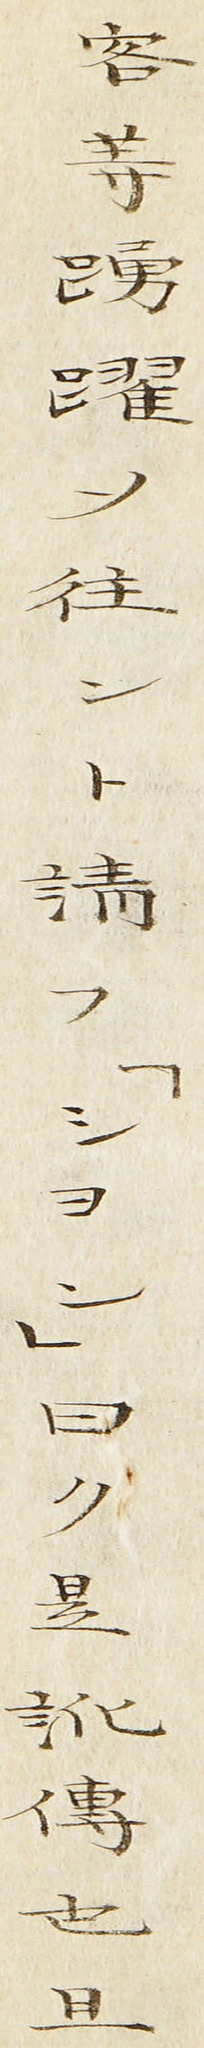客等踴躍シテ往ント請フ「シヨン」曰ク是訛伝也旦
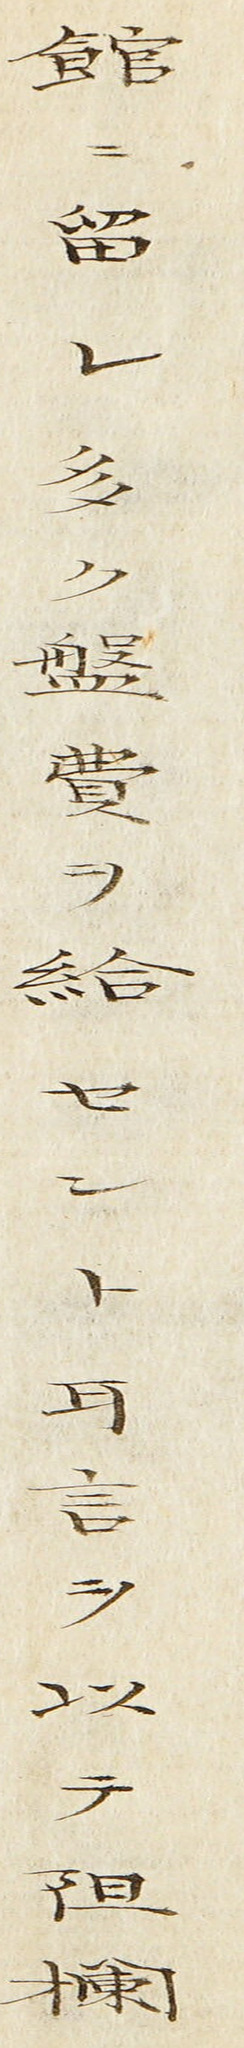館ニ留レ多ク盤費ヲ給セント甘言ヲ以テ阻欄
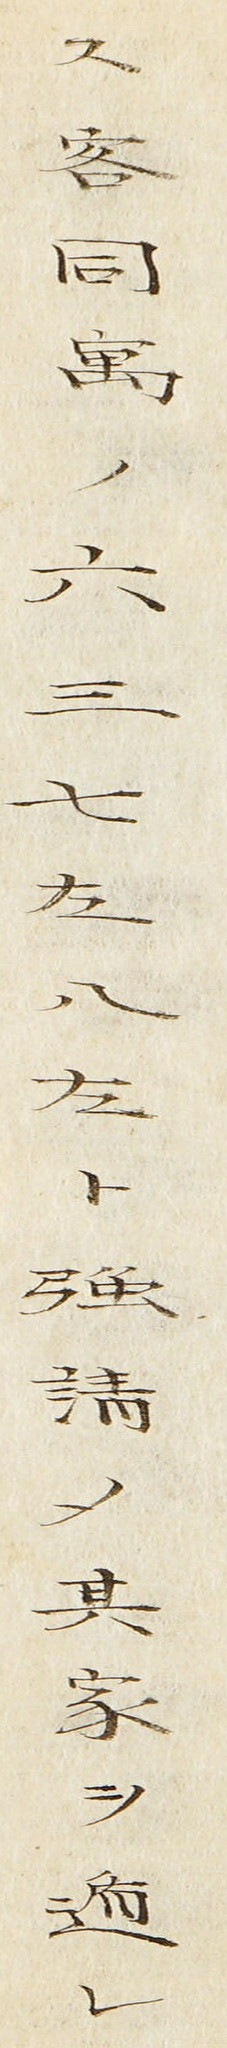ス客同寓ノ六三七左八左ト強請シテ其家ヲ遁レ
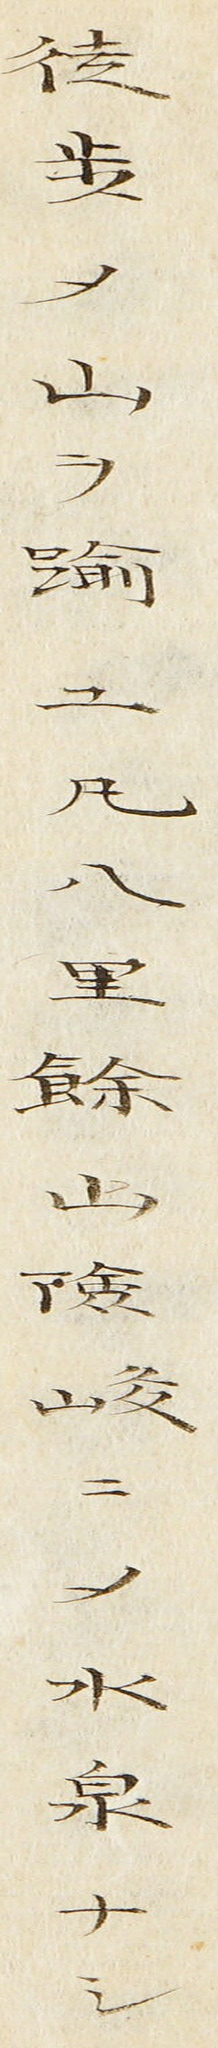徒歩シテ山ヲ踰ユ凡八里余山険峻ニシテ水泉ナシ
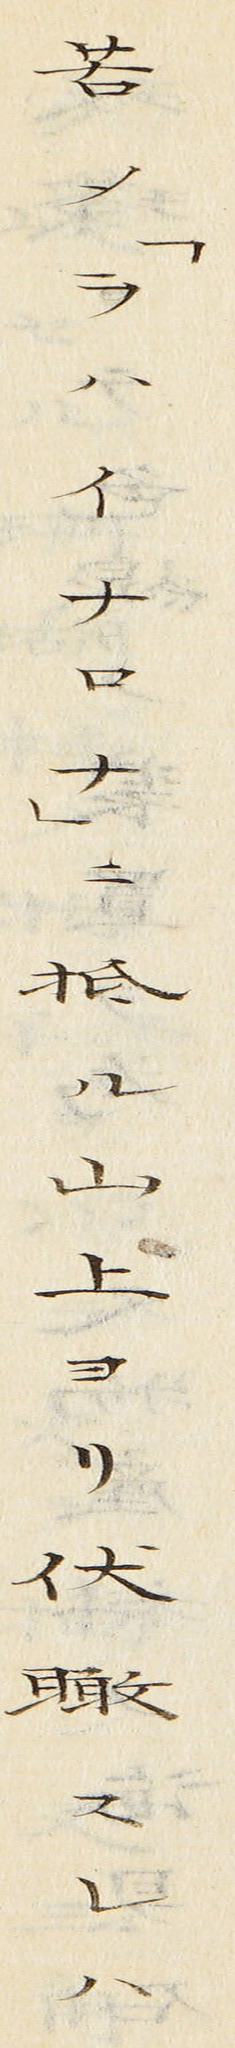苦シテ「ラハイナロナ」ニ抵ル山上ヨリ伏瞰スレハ
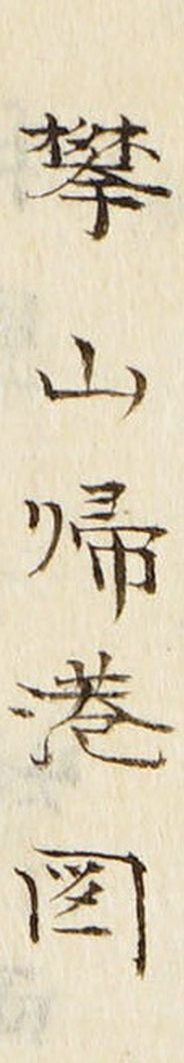攀山帰港図
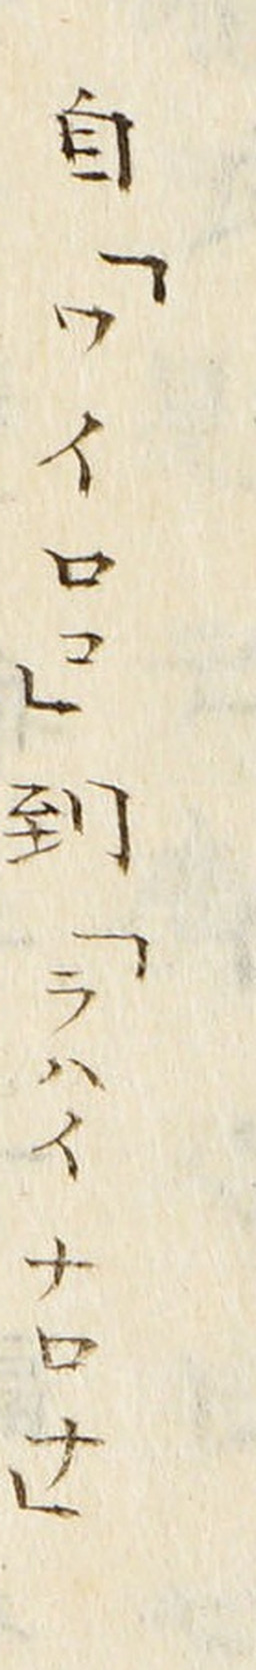自「ワイロコ」到「ラハイナロナ」
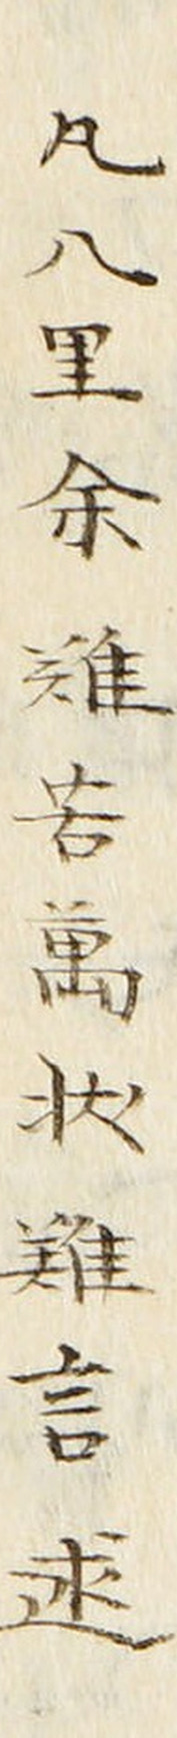凡八里余難苦万状難言述

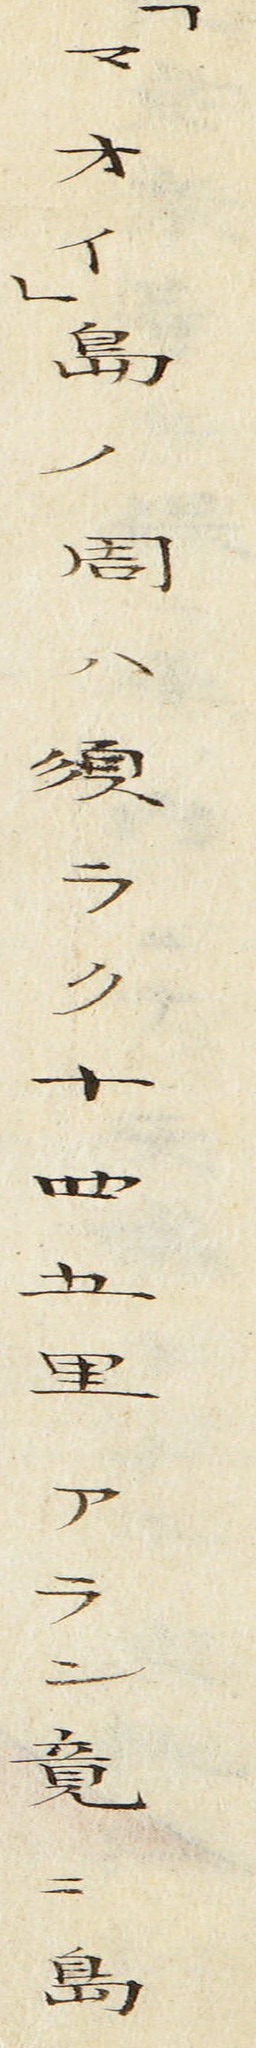「マオイ」島ノ周ハ須ラク十四五里アラン竟ニ島
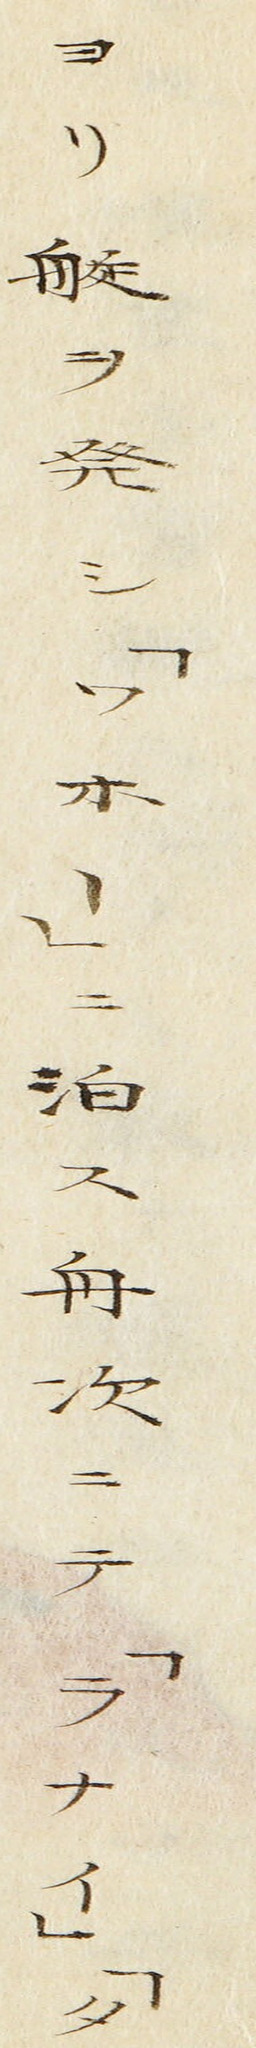ヨリ艇ヲ発シ「ワホー」ニ泊ス舟次ニテ「ラナイ」「タ
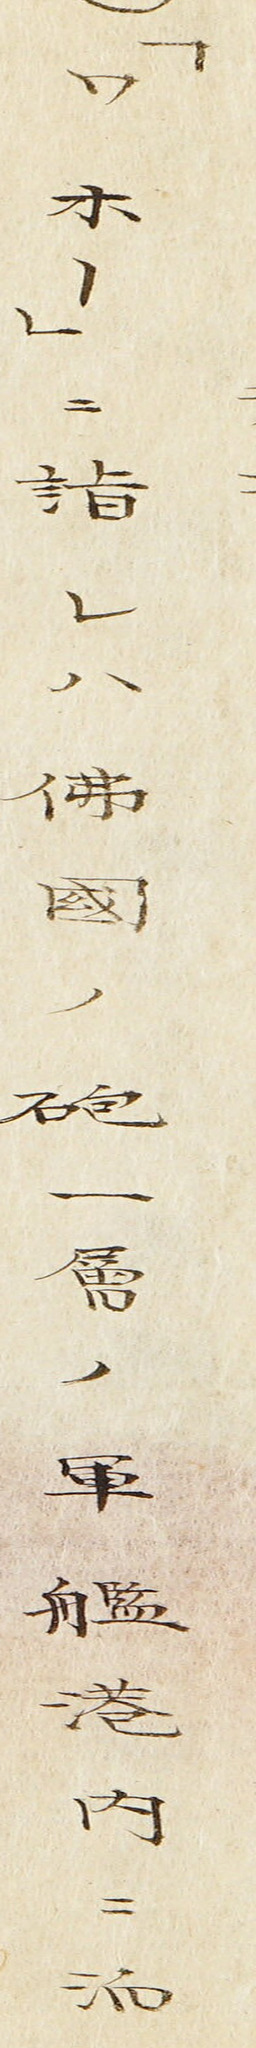○「ワホー」ニ詣レハ仏国ノ砲一層ノ軍艦港内ニ泊
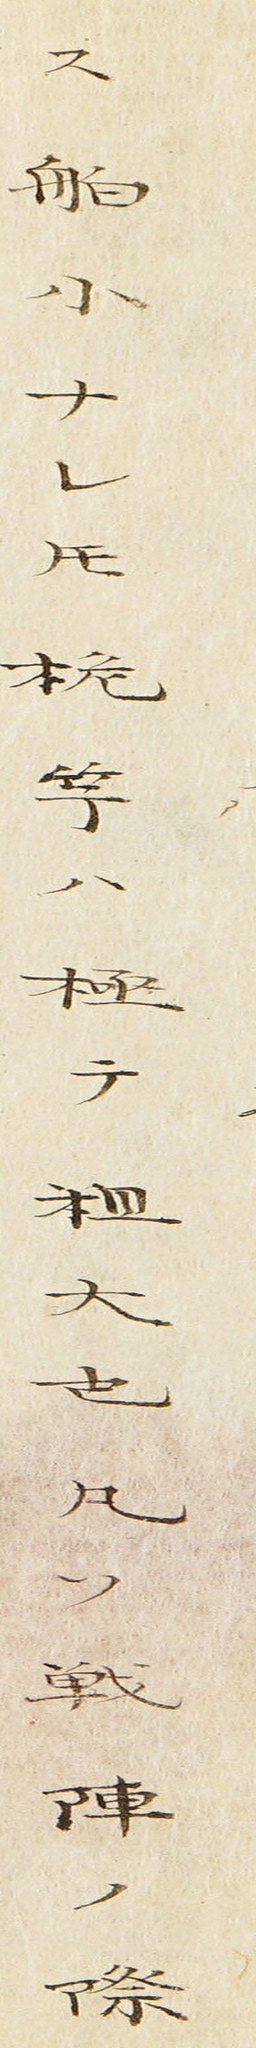ス舶小ナレトモ桅竿ハ極テ粗大也凡ソ戦陣ノ際
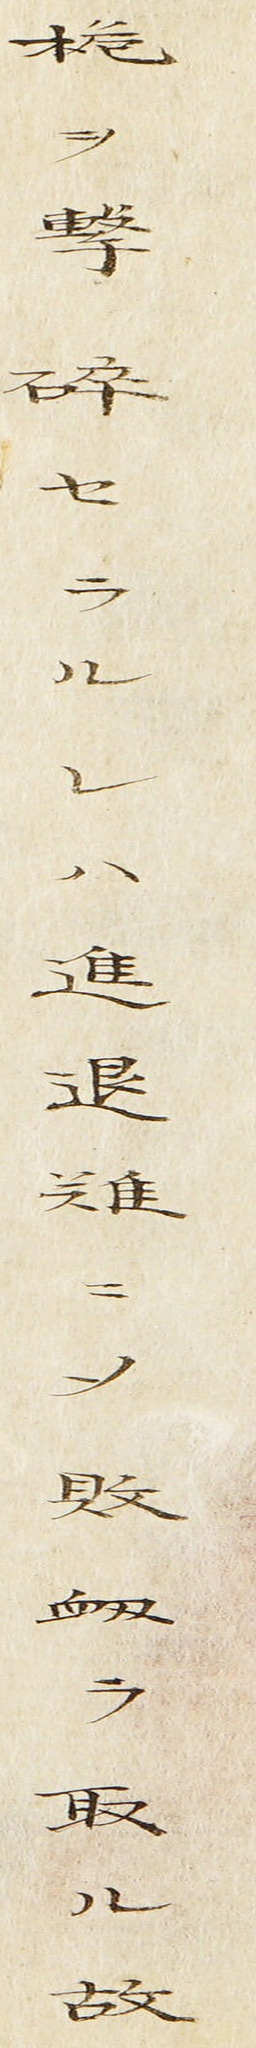桅ヲ撃砕セラルレハ進退難ニシテ敗衂ラ取ル故
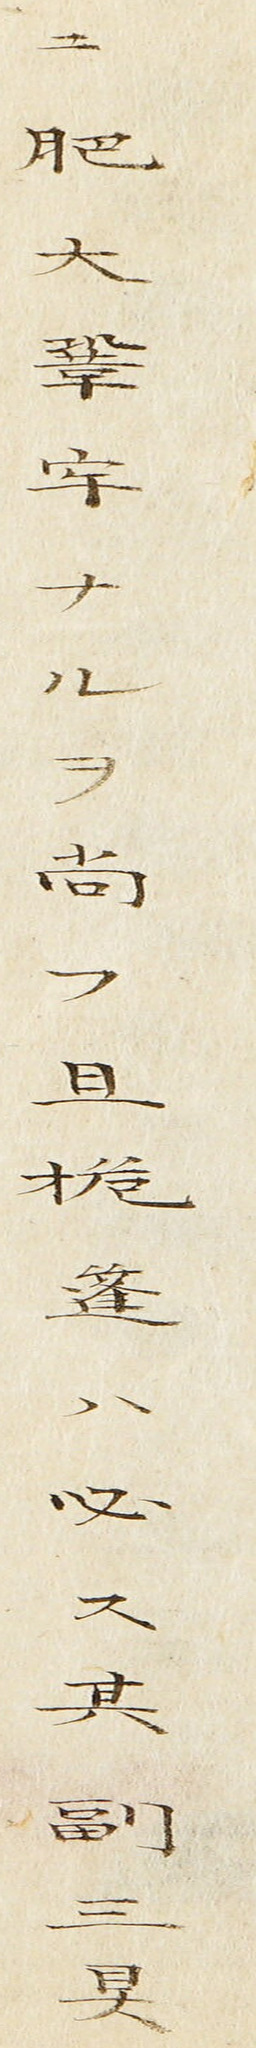ニ肥大鞏牢ナルヲ尚フ且桅篷ハ必ス其副三具
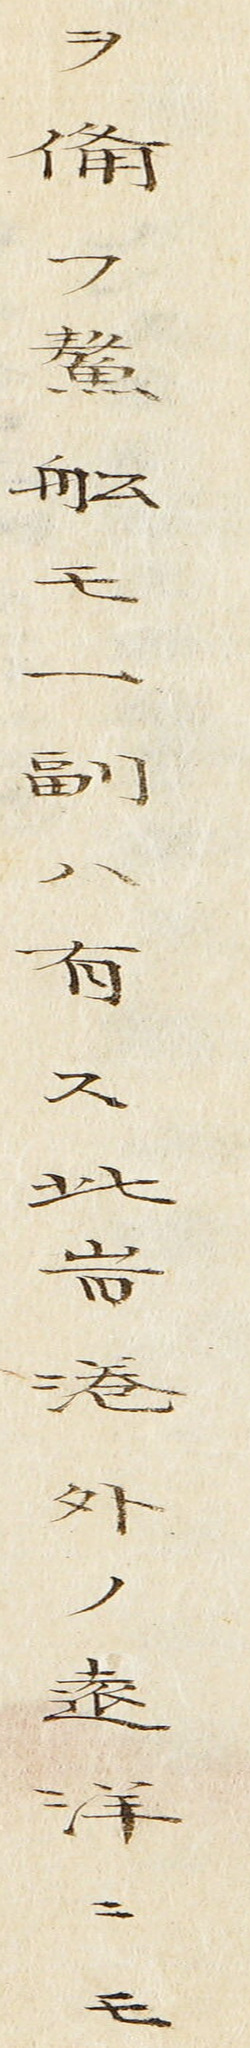ヲ備フ鰲舩モ一副ハ有ス此時港外ノ遠洋ニモ
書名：蕃談
